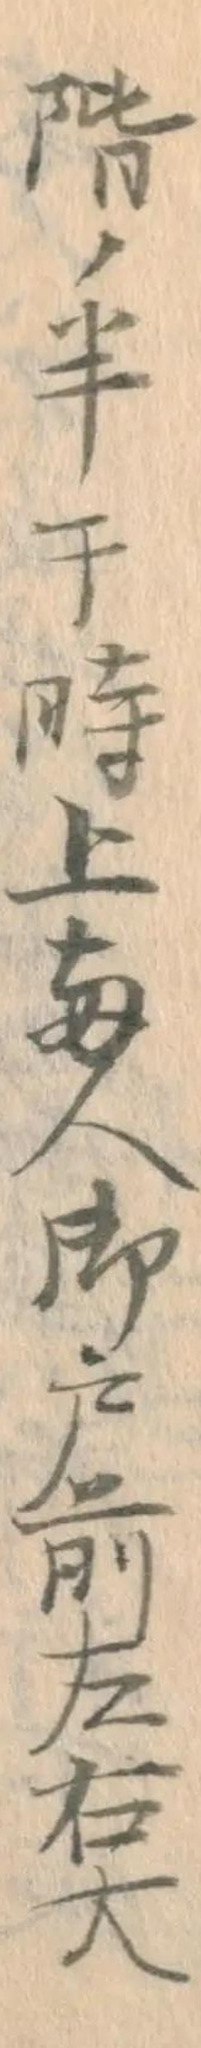階ノ半于時上両人御戸前左右大
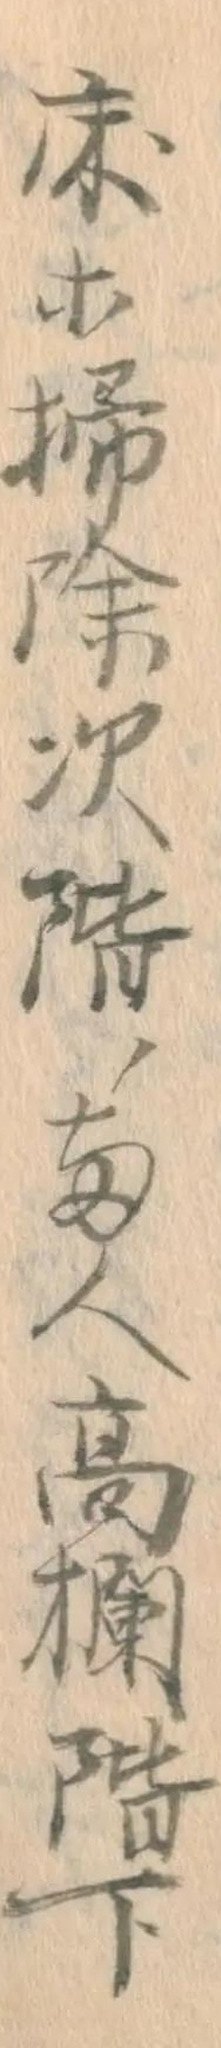床等掃除次階ノ両人高欄階下
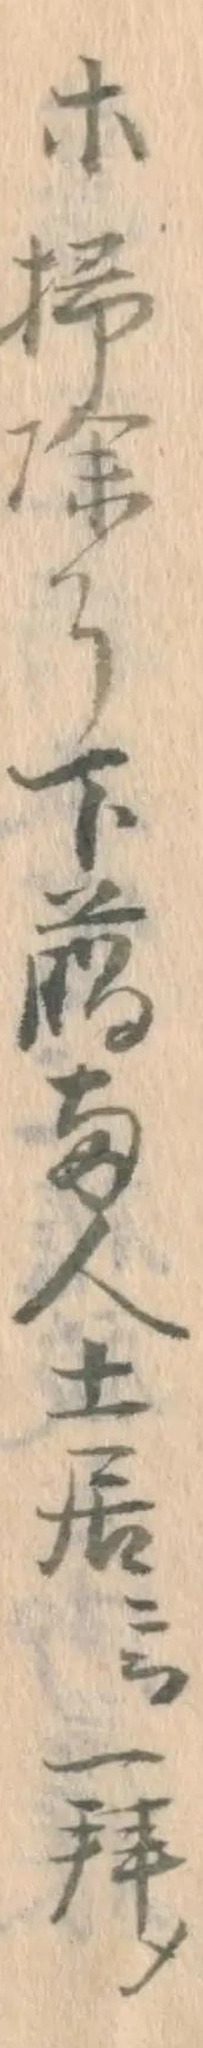等掃除了下臈両人土居ニ而一拝〆
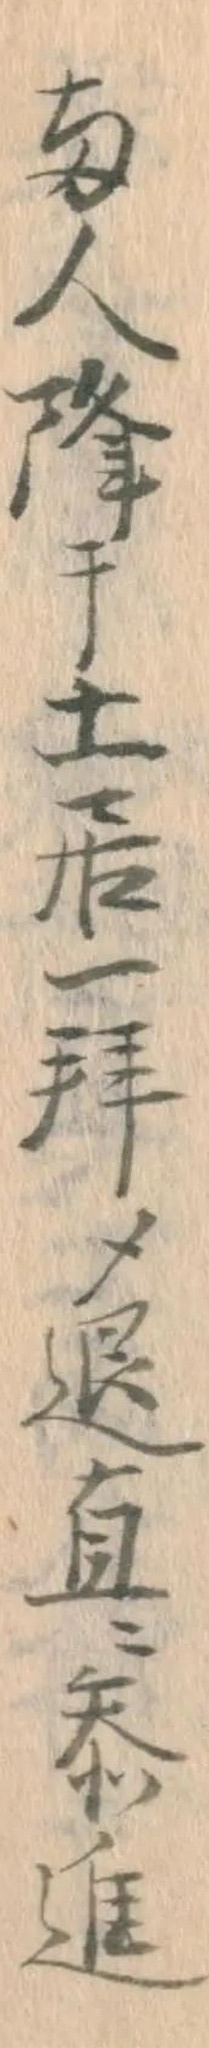両人降于土居一拝〆退直ニ参進
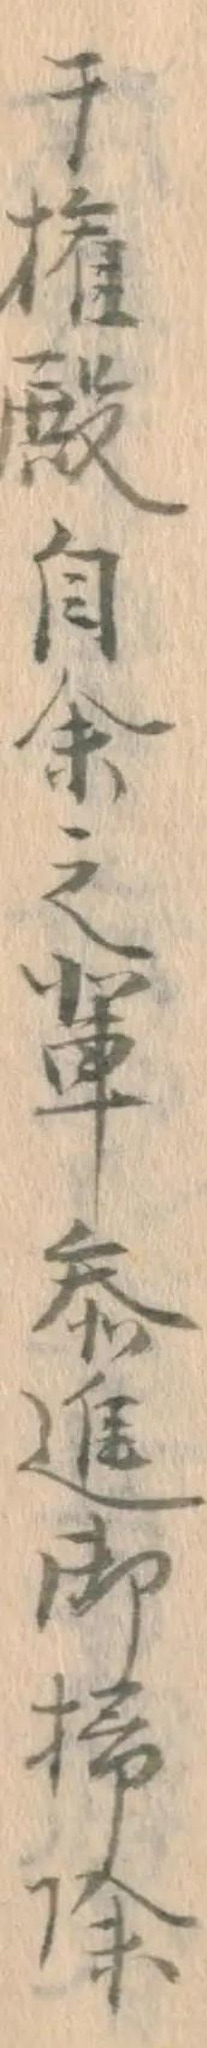于権殿自余之輩参進御掃除
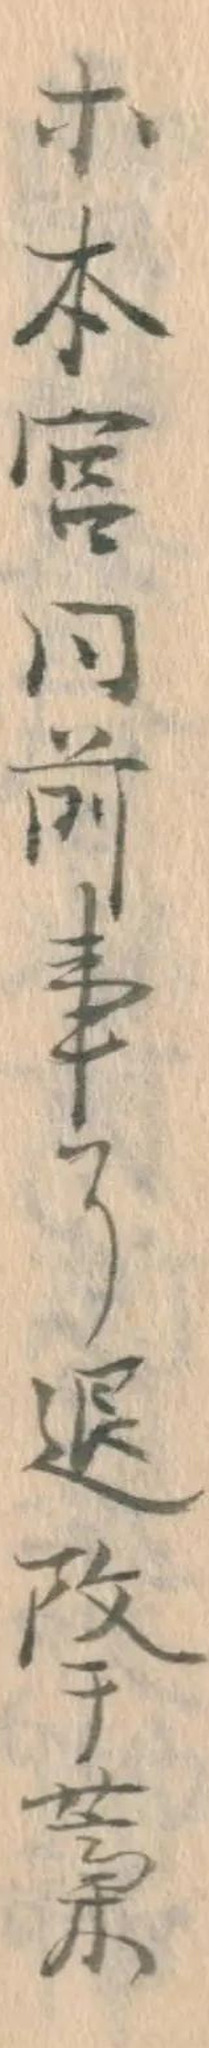等本宮同前事了退改于藁
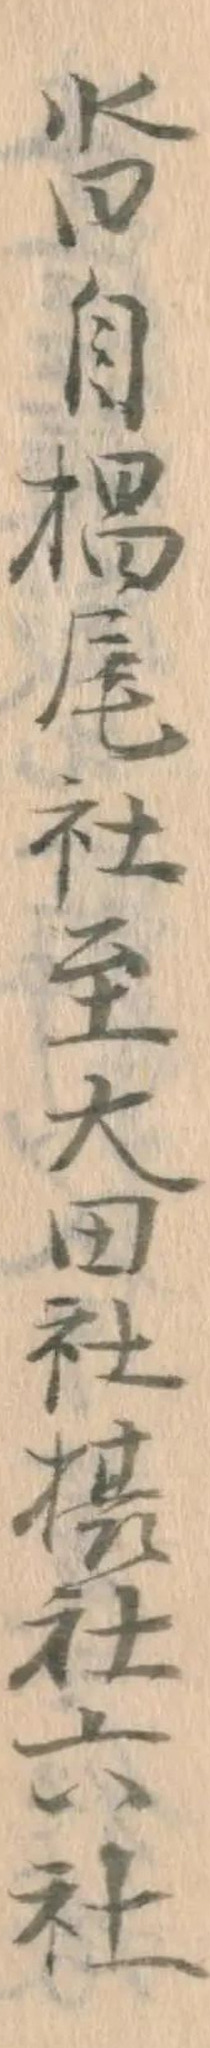沓自椙尾社至大田社摂社六社
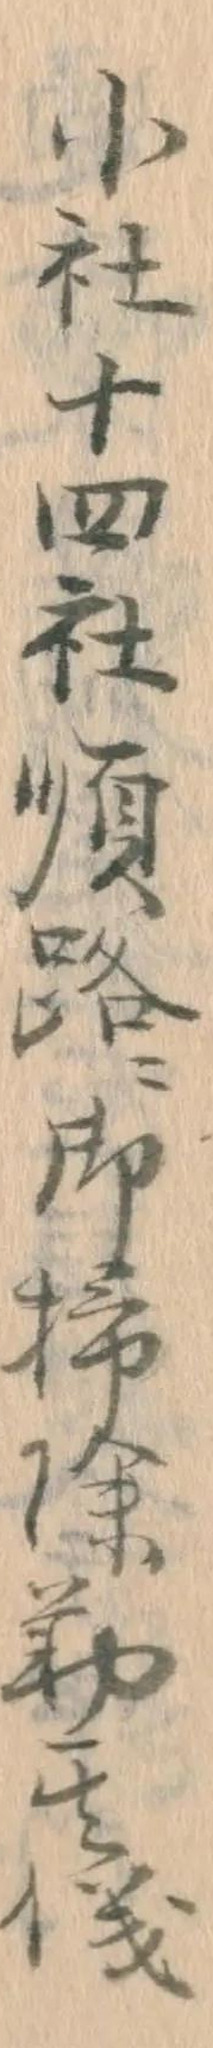小社十四社順路ニ御掃除勤其儀
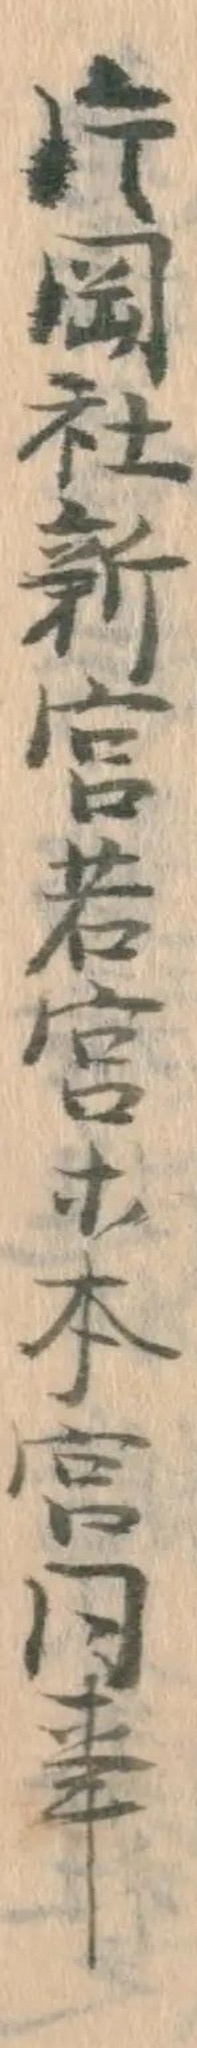片岡社新宮若宮等本宮同事
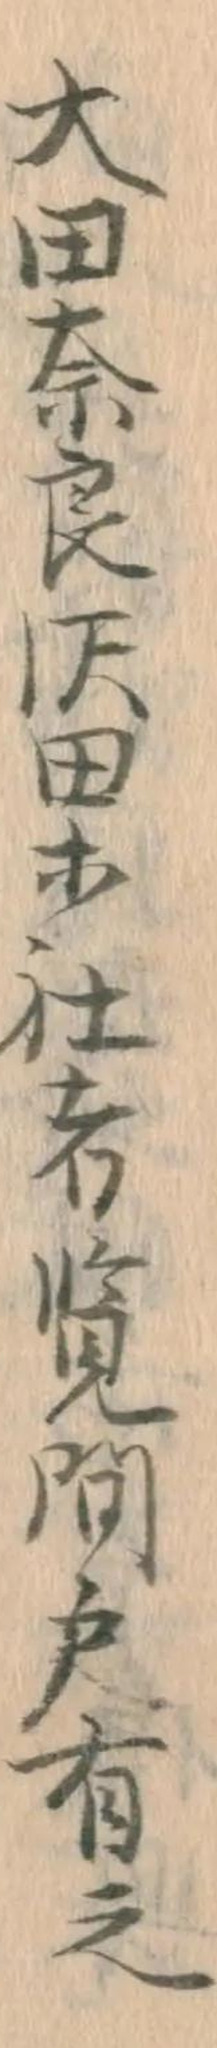大田奈良沢田等社者覧間戸有之
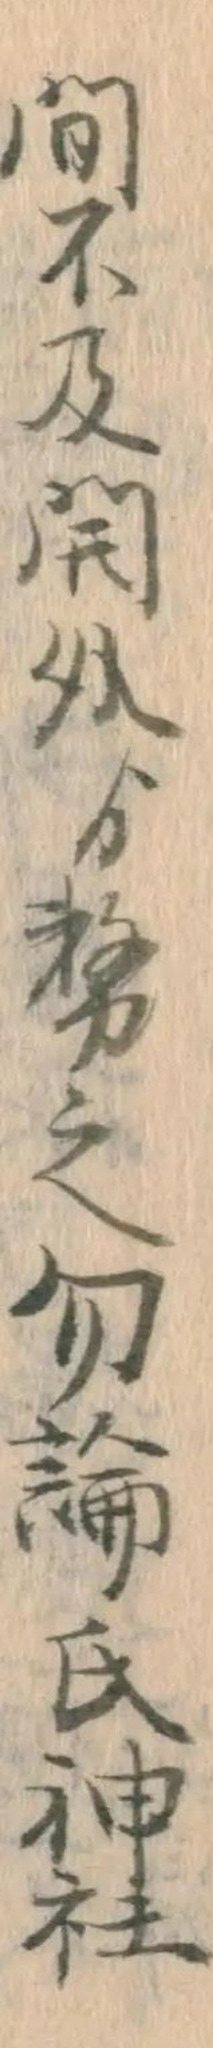間不及開外ゟ務之勿論氏神社
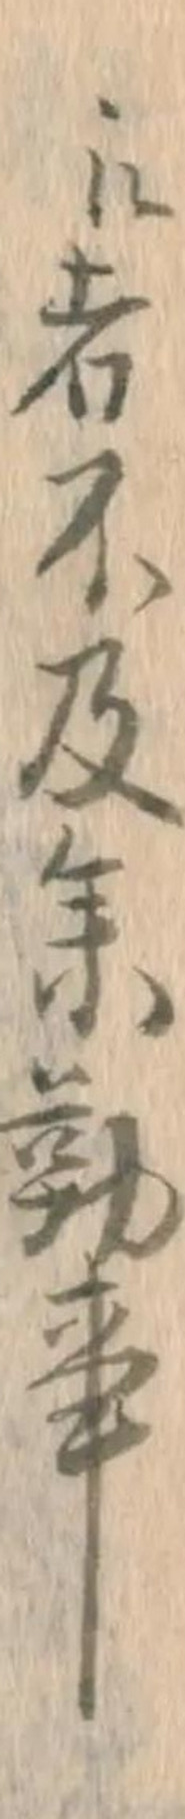え者不及参勤事
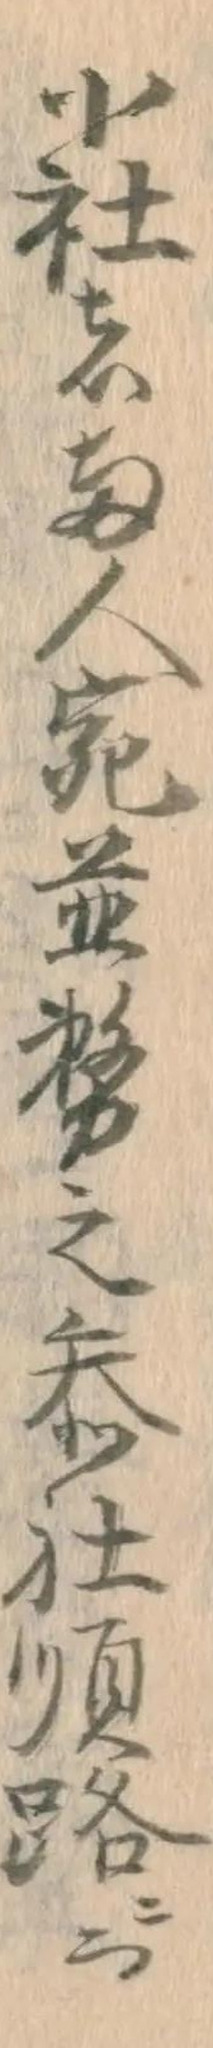小社者両人宛並務之参社順路ニ而
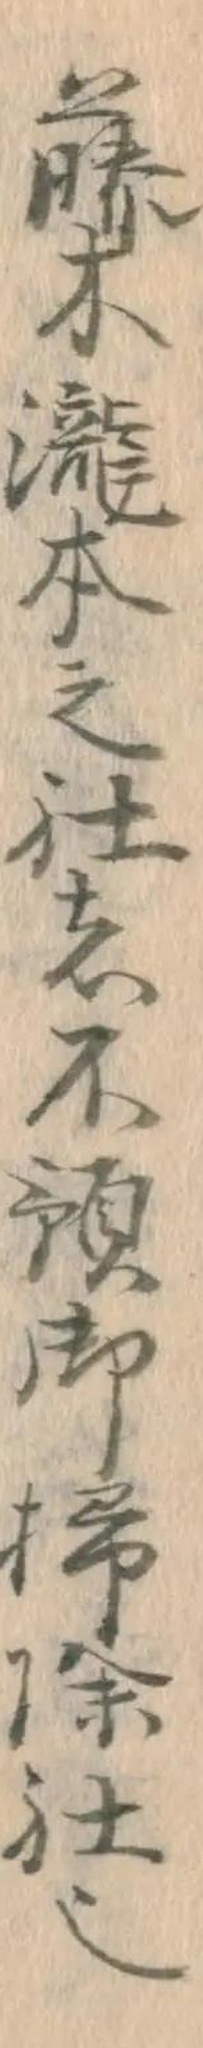藤木瀧本之社者不預御掃除社也
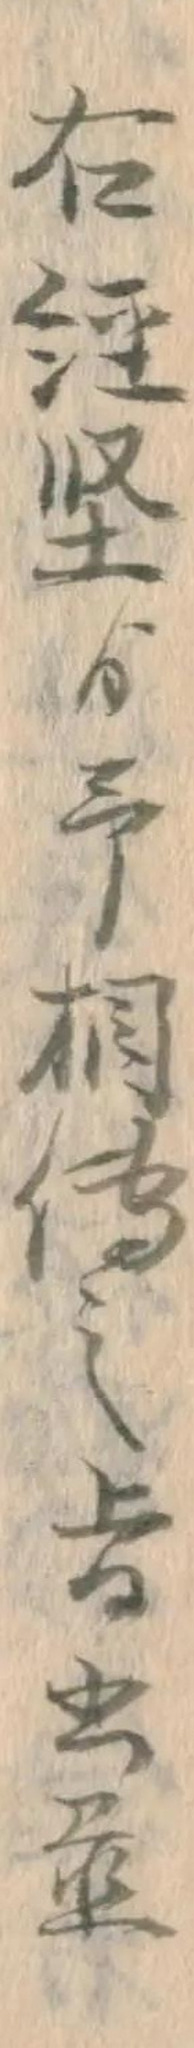右経堅ゟ予相傳之旨書置
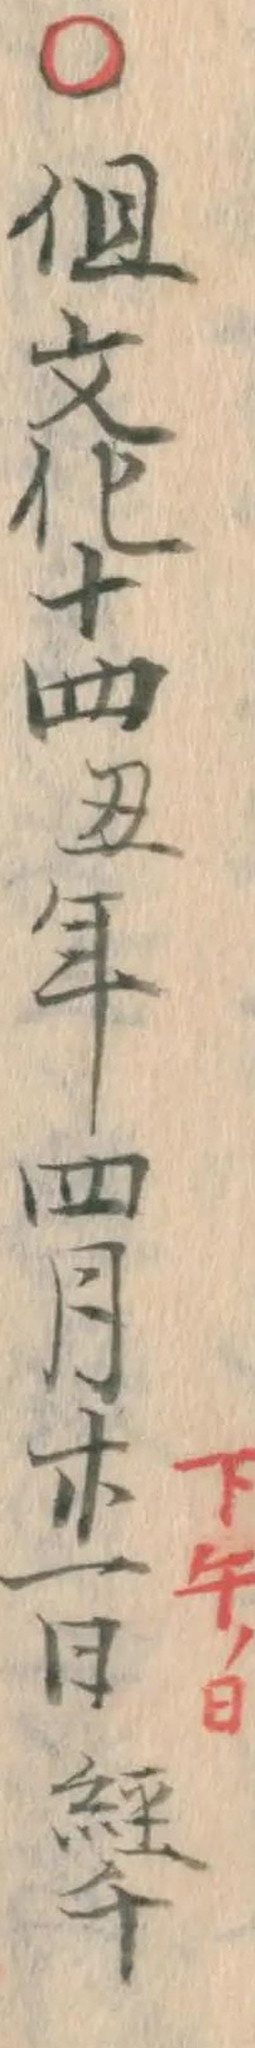○但文化十四丑年四月廿一日経千
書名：賀茂社記録. 第81冊
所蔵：国立国会図書館 National Diet Library, JAPAN
